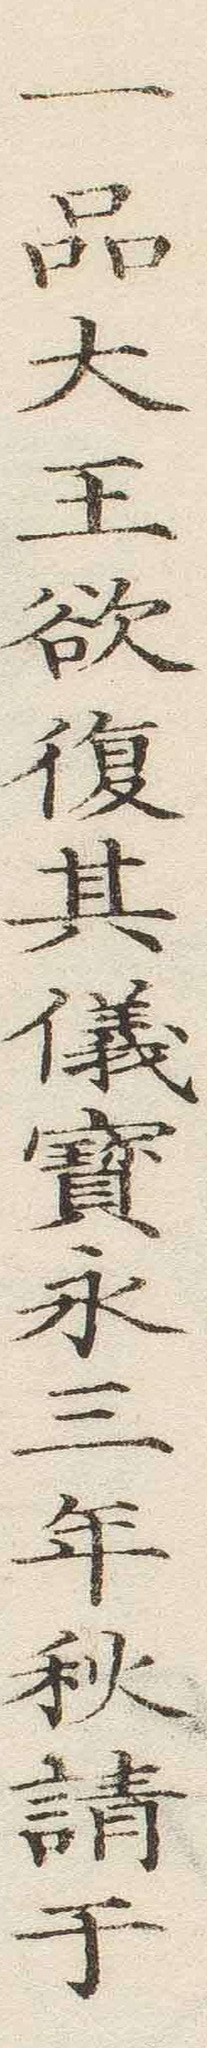一品大王欲復其儀寶永三年秋請于
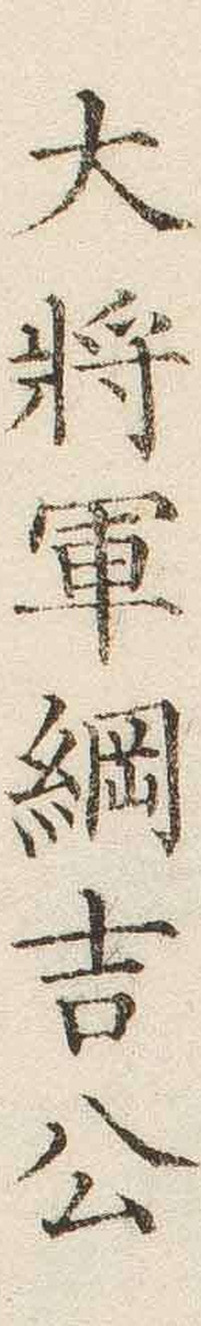大將軍綱吉公
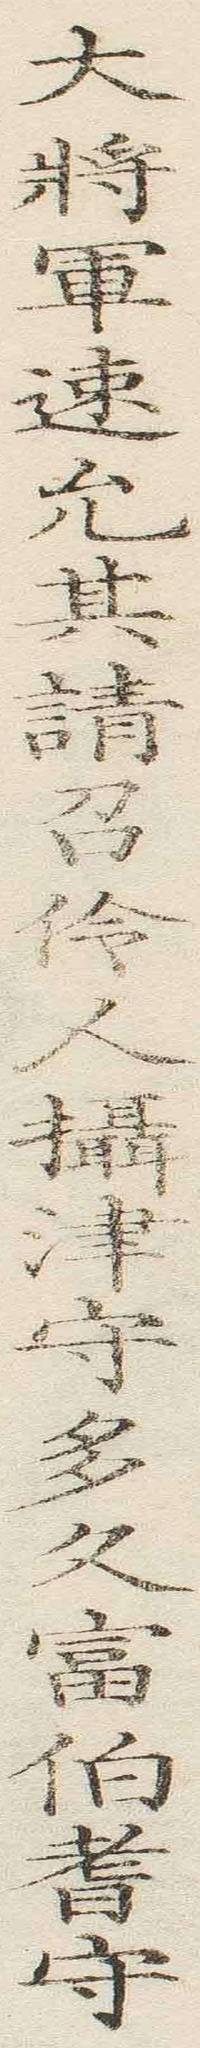大將軍速允其請召伶人攝津守多久富伯耆守
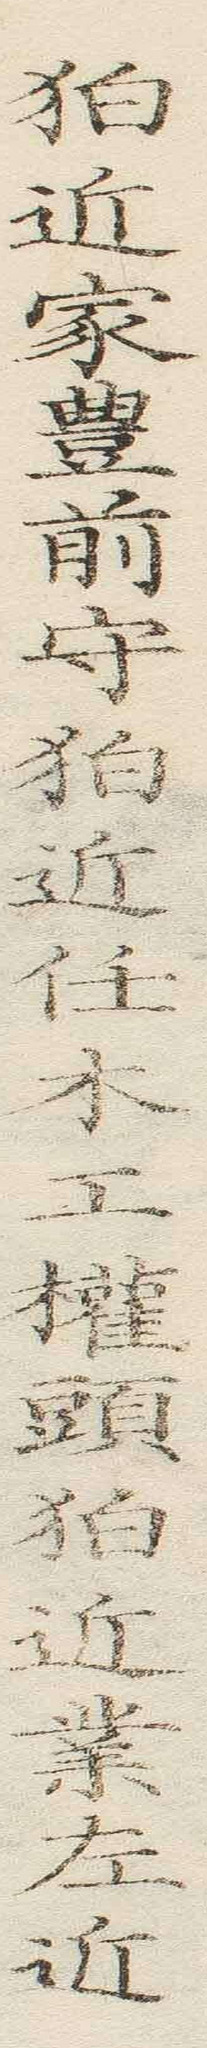狛近家豊前守狛近任木工權頭狛近業左近
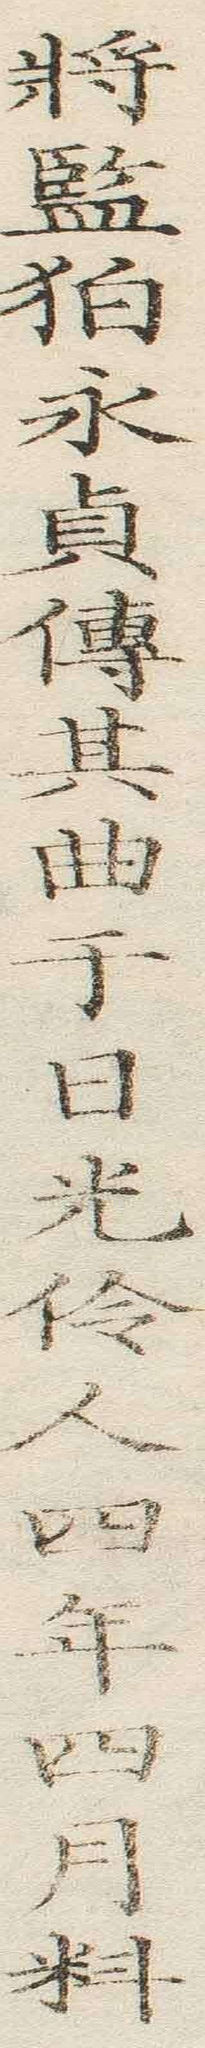將監狛永貞傳其曲于日光伶人四年四月料
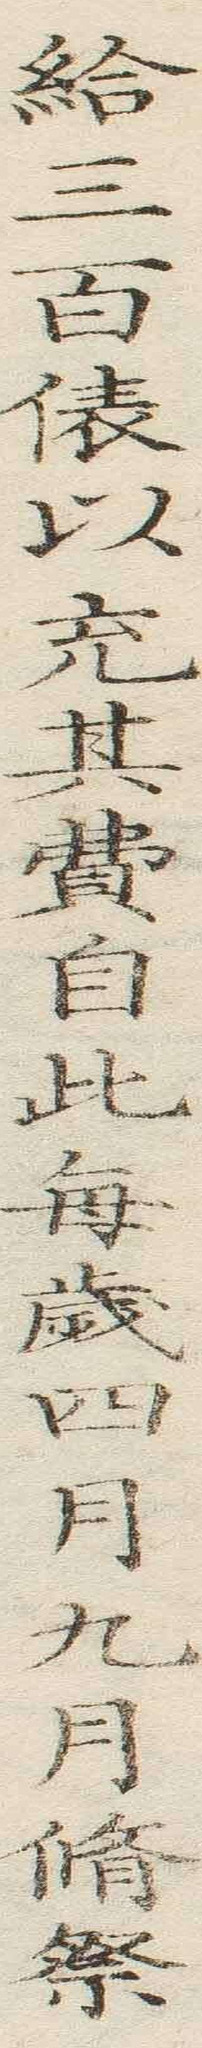給三百俵以充其費自此每歲四月九月脩祭
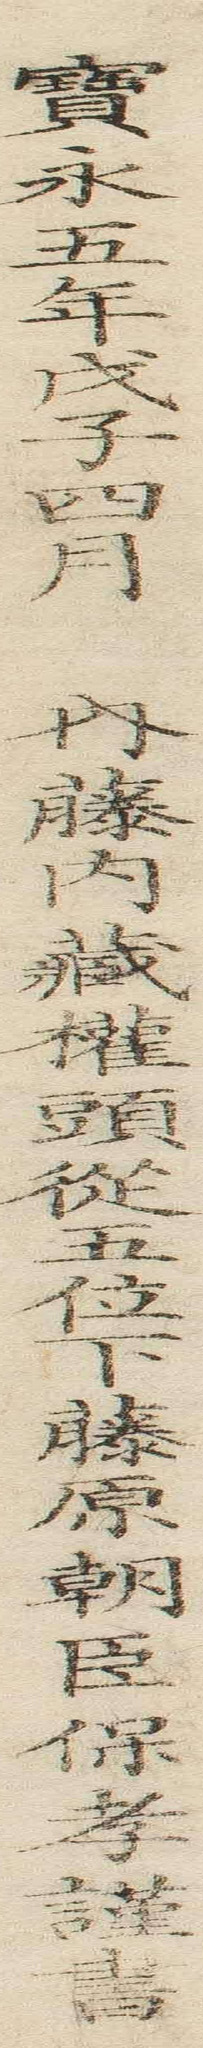寶永五年戊子四月内藤内藏權頭從五位下藤原朝臣保孝謹書

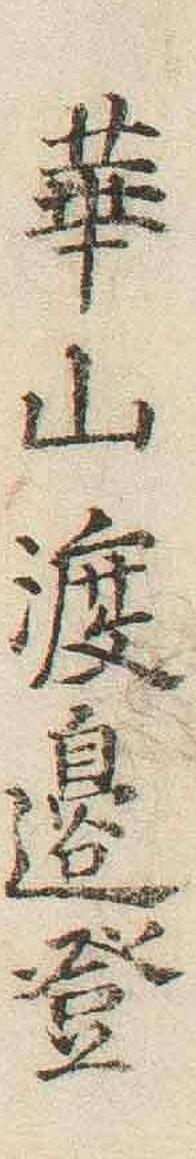華山渡邉登
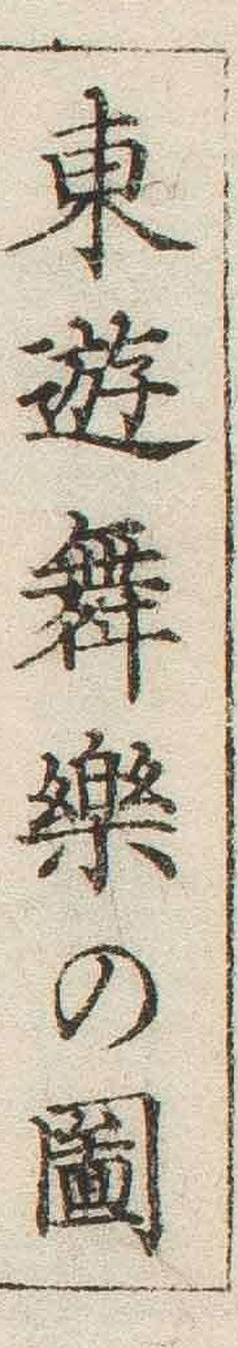東遊舞樂の圖

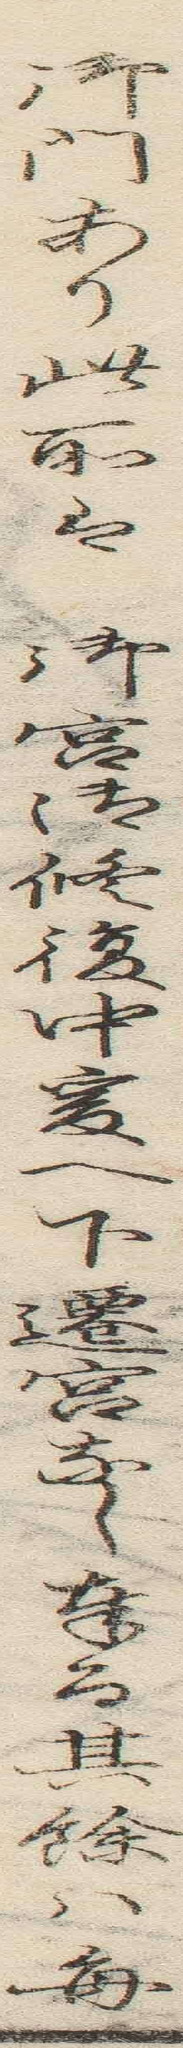御門あり此所は御宮御修復中爰へ下遷宮なし奉る其餘は每
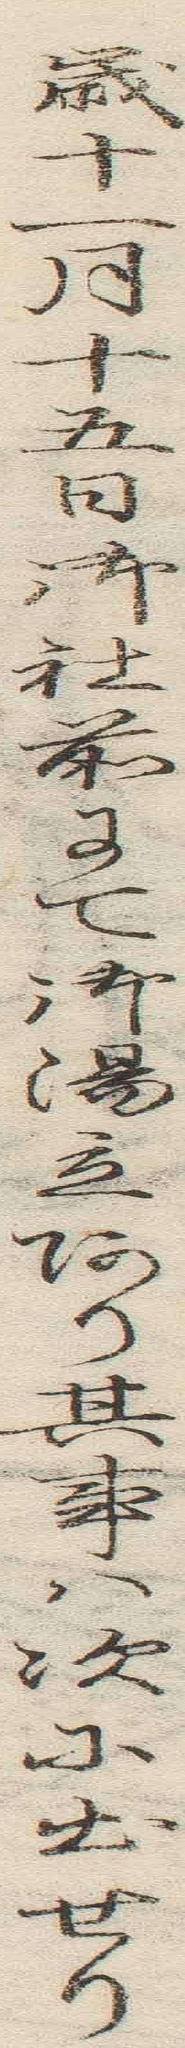歳十一月十五日御社前にて御湯立あり其事は次に出せり
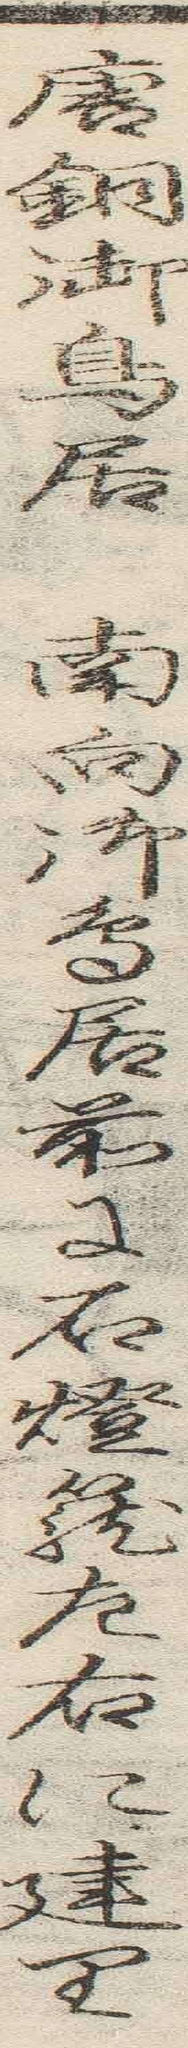唐銅御鳥居南向御鳥居前に石燈籠左右に建り
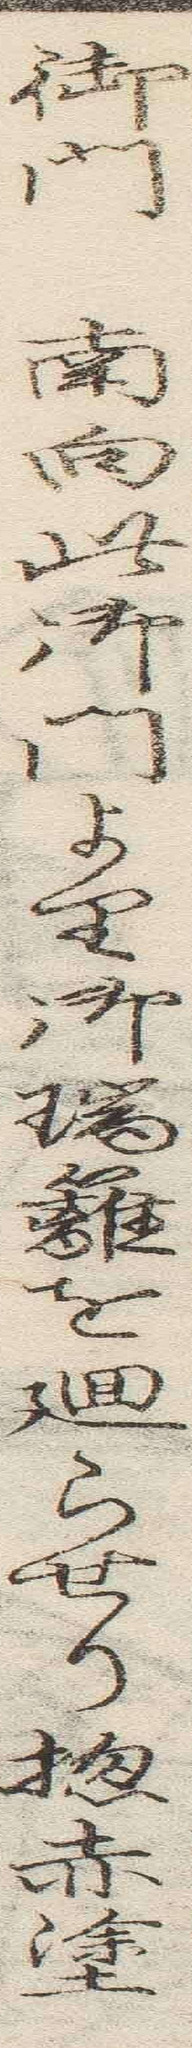御門南向此御門より御瑞籬を廽らせり揔赤塗
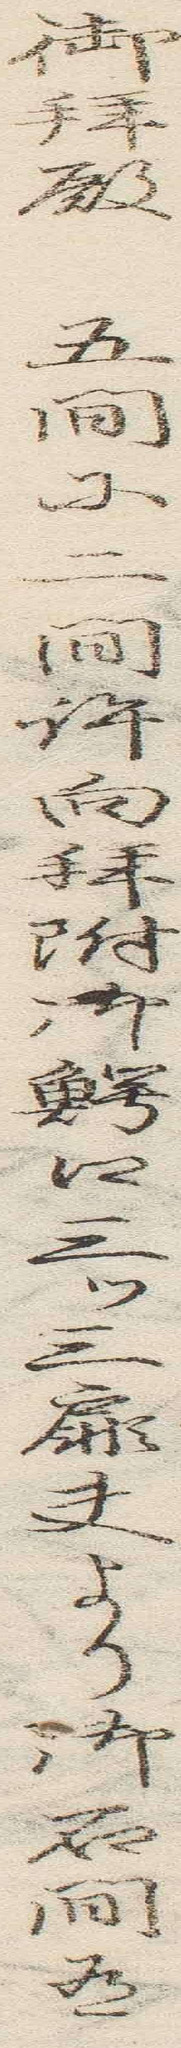御拜殿五間に二間許向拜附御鰐口三ッ三扉夫より御石間有
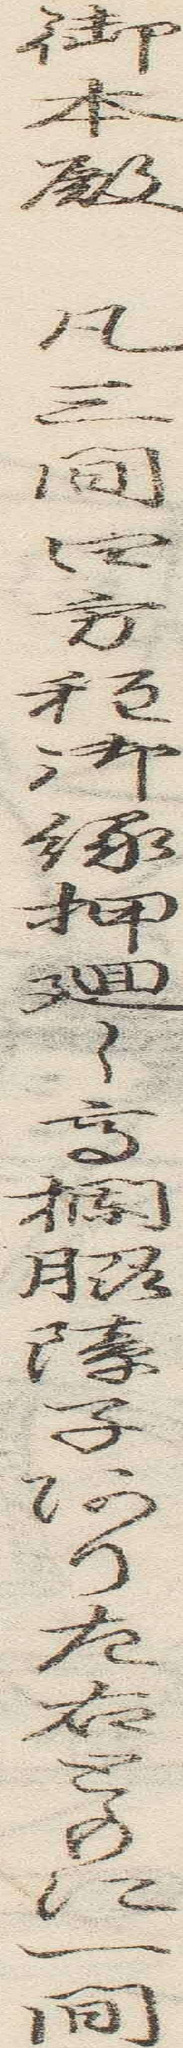御本殿凡三間四方程御縁押廽し高欄脇障子あり左右ともに一間
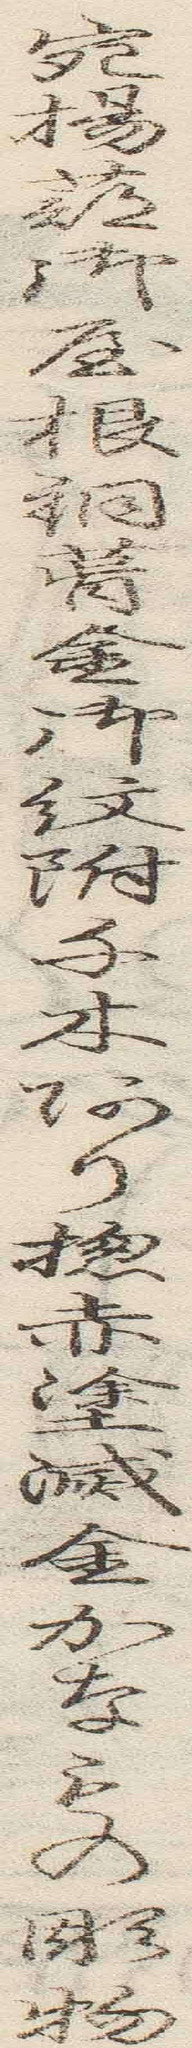宛揚蔀御屋根銅葺金御紋附千木あり揔赤塗滅金かなもの彫物
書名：日光山志
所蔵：東京学芸大学附属図書館 国文学研究資料館
